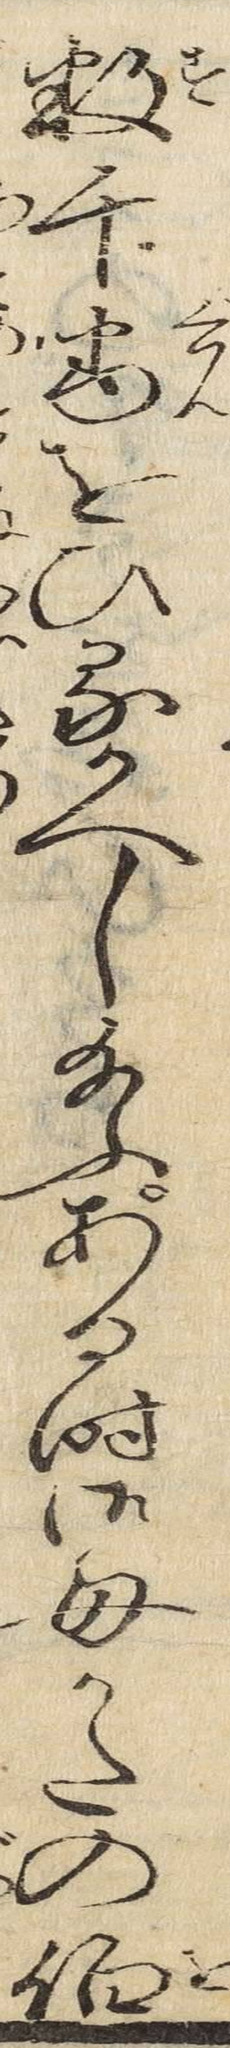数千巻をひるかへし給ふ。ある時御母方の伯
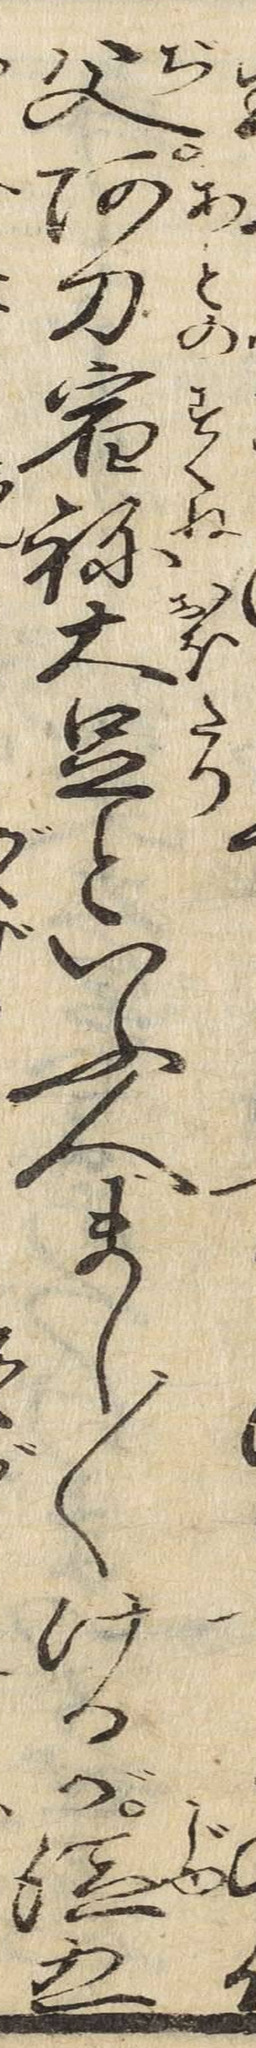父。阿刀宿禰大足といふ人まし〳〵けるが。従五
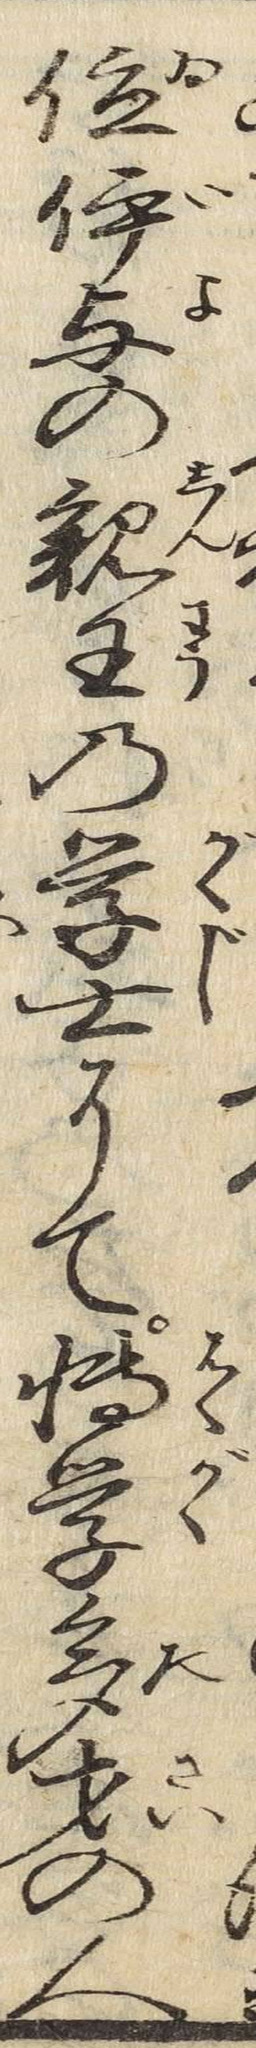位伊与の親王の学士にて。博学多才の人
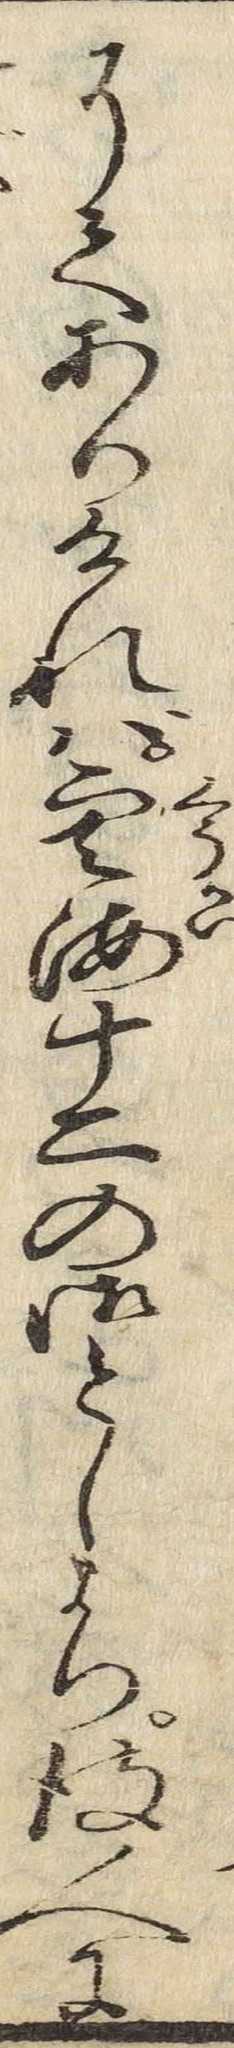にてありければ。空海十二の御としより。博人に
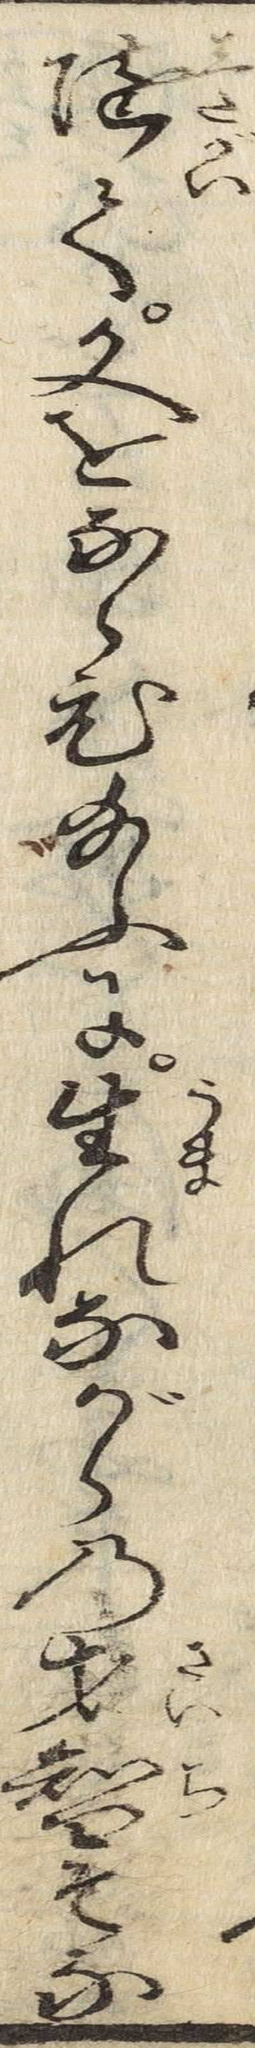随て。文をならひ給ふに。生れながらの才智そな
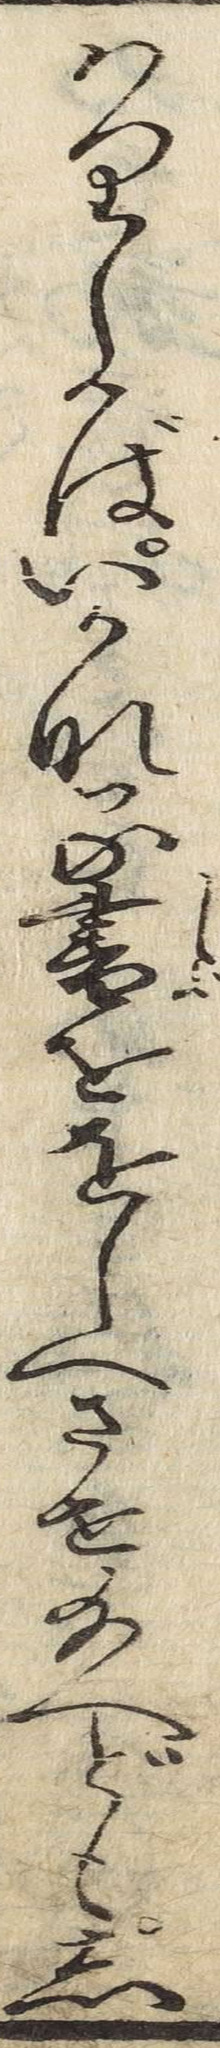はりしかば。いかなる書ををしへさせ給へどもし
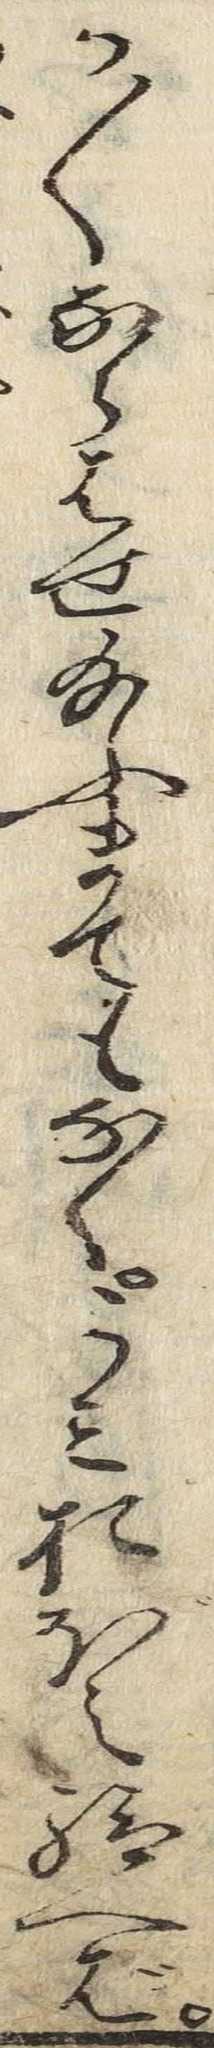か〳〵ならはせ給ふまてもなく。よみおぼえ給へば。
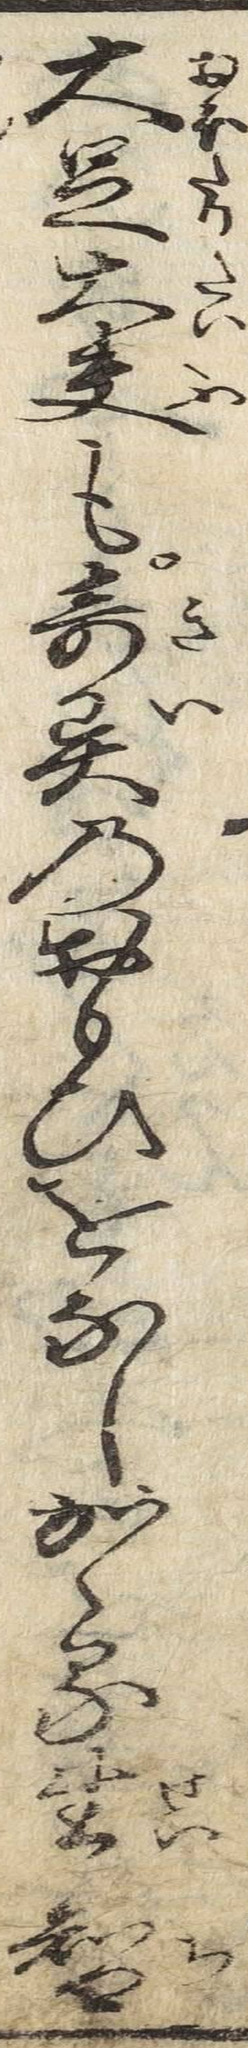大足大夫も。奇異のおもひをなしかゝる生智
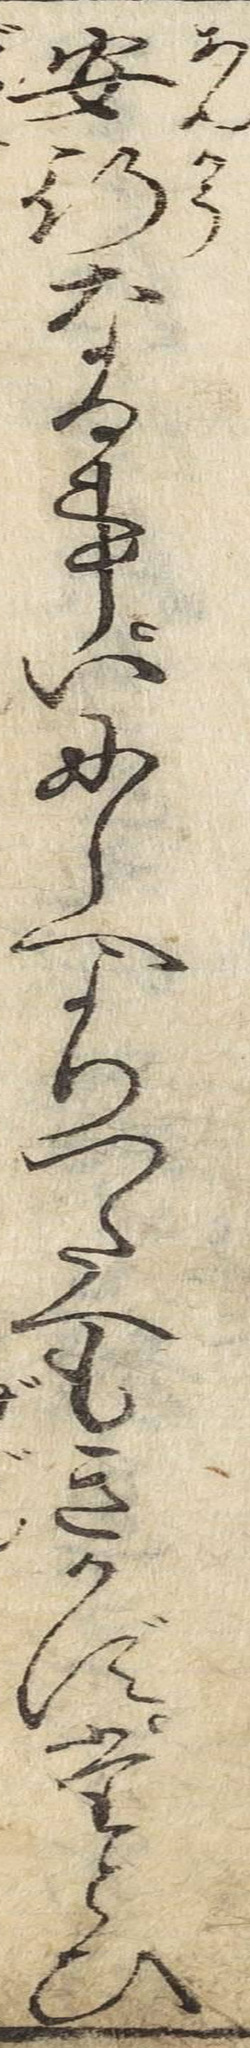安行なる事いにしへよりつたへもきかず。たとひ
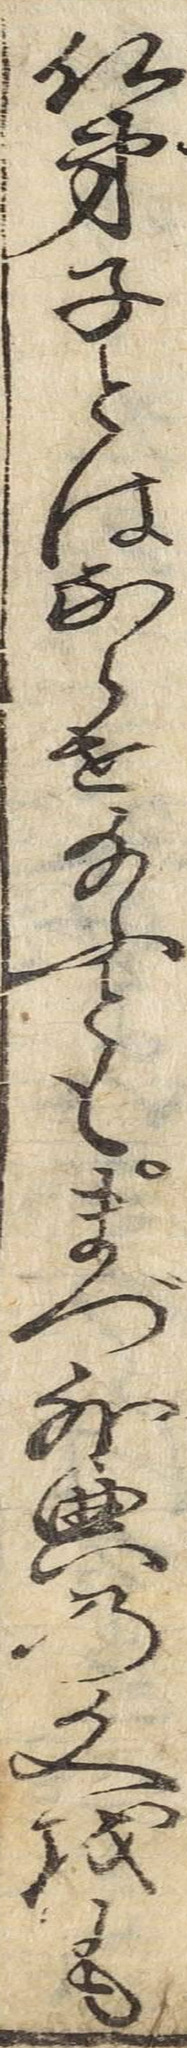仏弟子とはならせ給ふとも。まづ外典の文をも

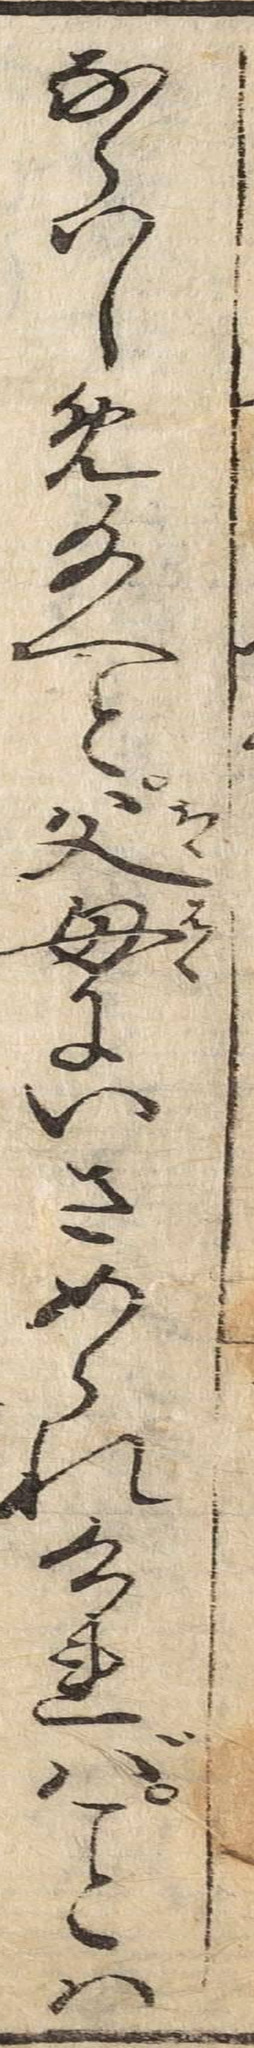ならはしめ給へと。父母にいさめられければことは
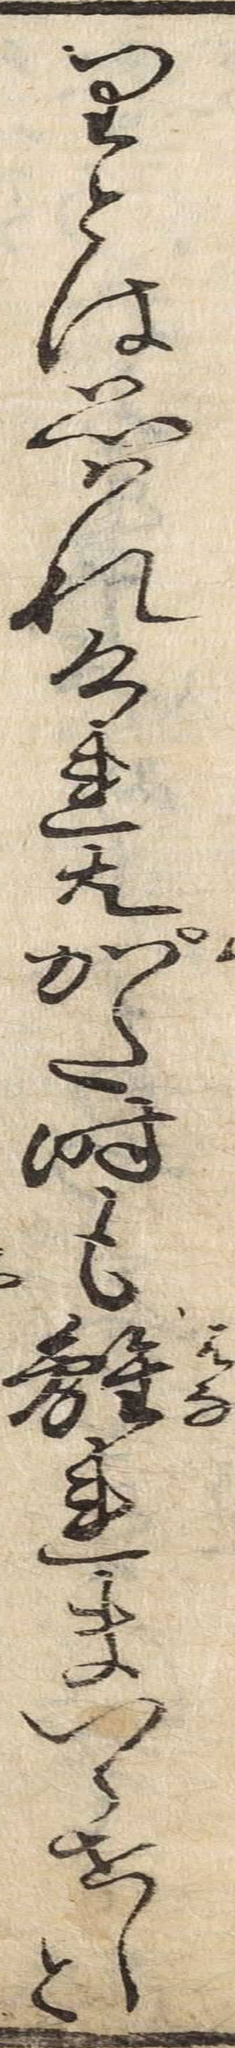りとは思はれけれ共。かた時も離れまいらせしと
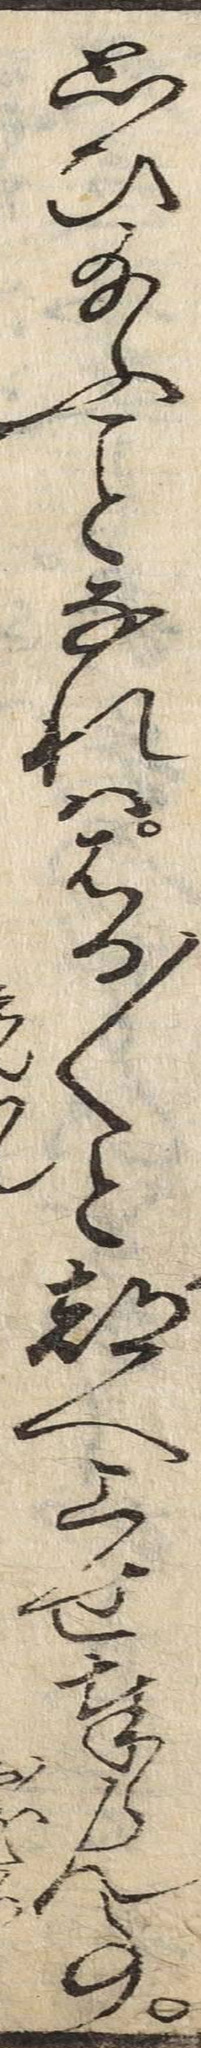思ひ給ふとなれは。はる〳〵と都へ上せ奉らん事。
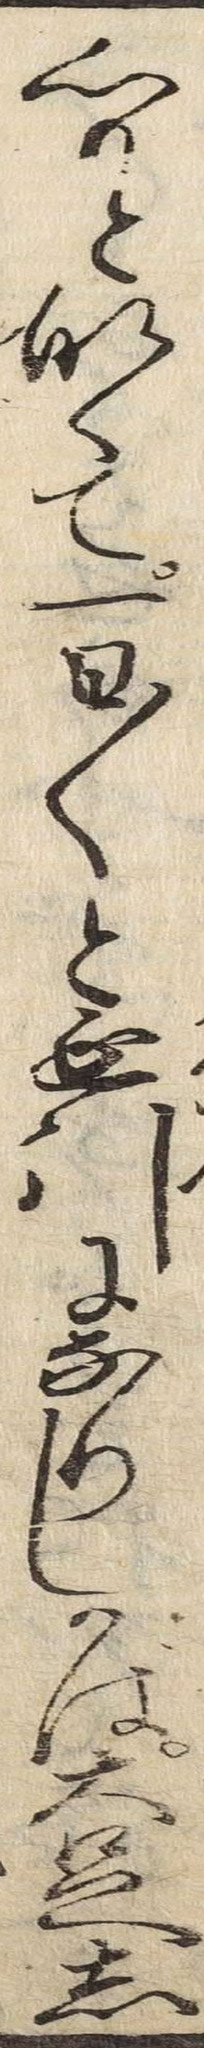心もとなくて。一わ〳〵と延引になりしかば。大足し
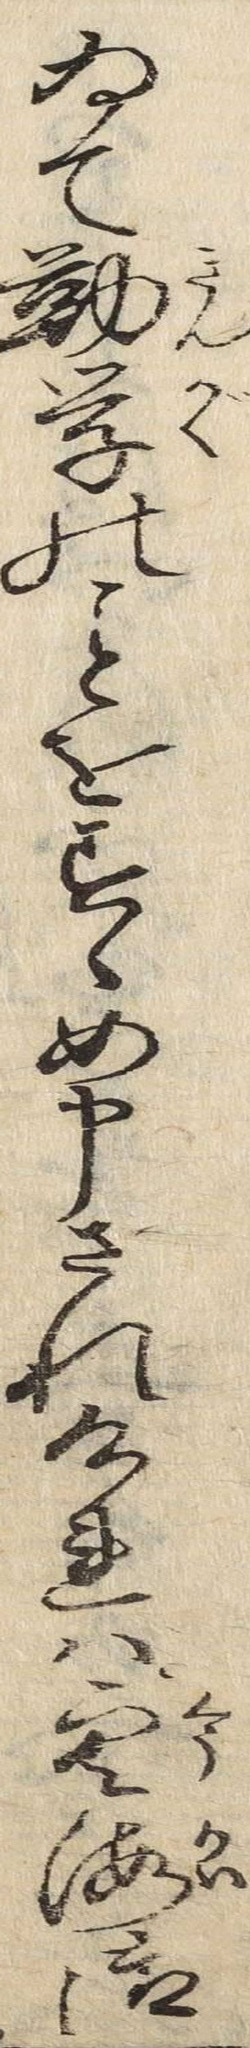ゐて勤学のことをすゝめ申されけれは。空海御
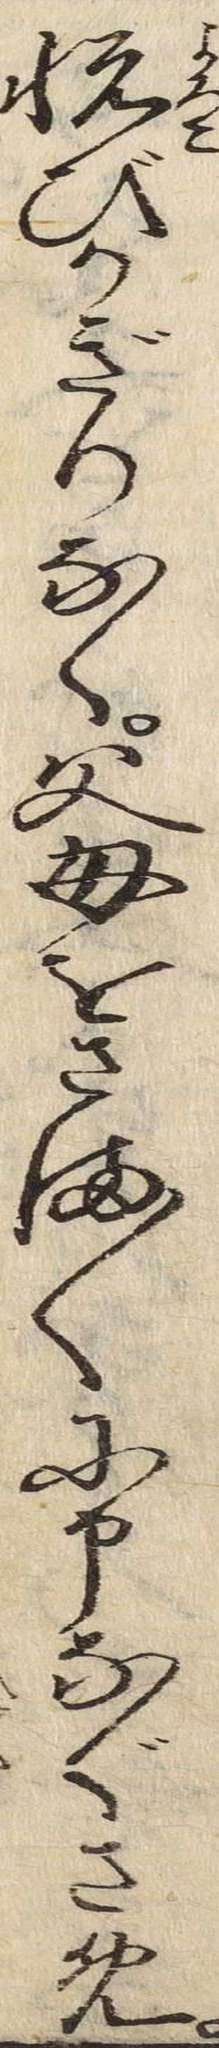悦びかぎりなく。父母をさま〳〵に申なくさめ。
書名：弘法大師御傳記
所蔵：京都府立京都学・歴彩館 国文学研究資料館
